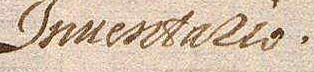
Inuentario.
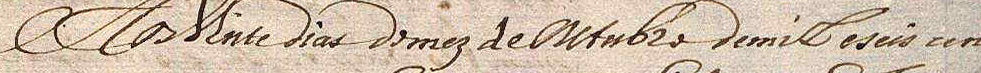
Aos Vinte dias do mez de Outubro de miL e seiscen
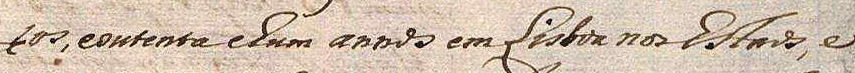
tos, e outenta e hum annos em Lisboa nos Estaos, e
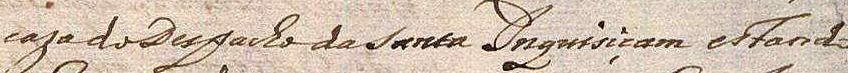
caza do Despacho da santa Inquisiçam estando
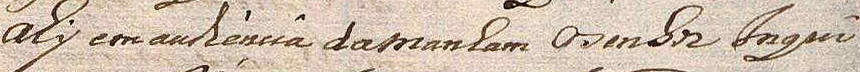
ahy em audiençia da manham o senhor Inqui
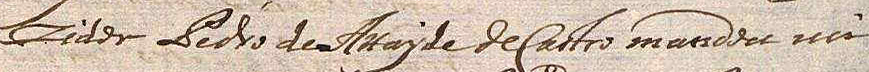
Zidor Pedro de Attayde de Castro mandou uir
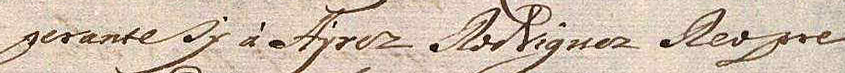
perante sy à Ayres Rodriguez Reo pre
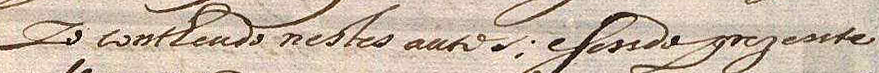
Zo contheudo nestes autos; e sendo prezente
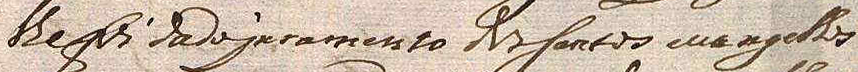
lhe foi dado juramento dos santos euangelhos
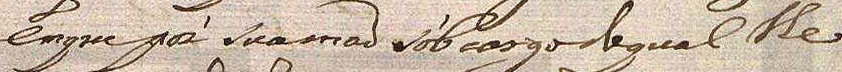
em que poz sua maõ sob cargo do qual lhe
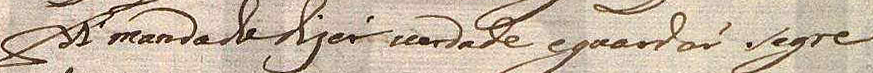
foi mandado dizer uerdade e guardar segre
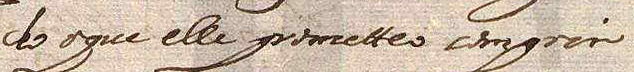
do o que elle prometteo comprir.
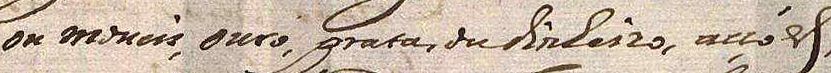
ou moueis, ouro, prata, ou dinheiro, acções,
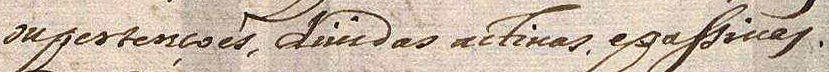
ou pertençoẽs, diuidas actiuas, e passiuas?
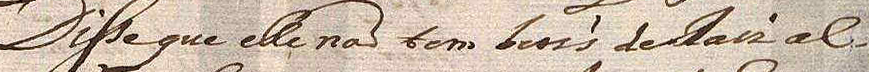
Disse que elle naõ tem beñs de Raiz al
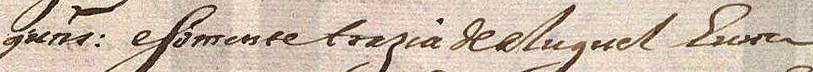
guñs: e sómente trazia de aluguel hum
